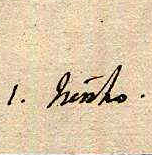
1. Iuñho.
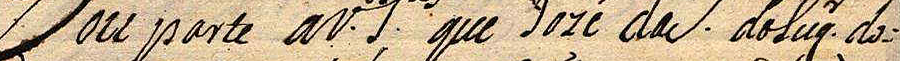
Dou parte a v.as s.as que Iozé da S.a do Lug.r do
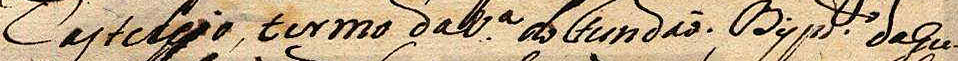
Castelejo, termo da v.a do Fundaõ. Bispd.o da Gu
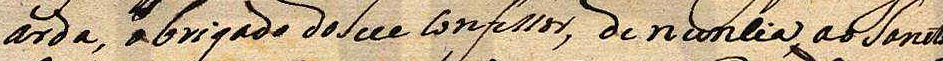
arda, obrigado do seu confessor, denuncia, ao Sancto
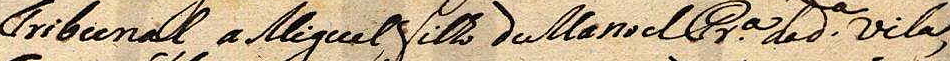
Tribunal, a Miguel, filho de Manoel Pr.a da d.a vila,
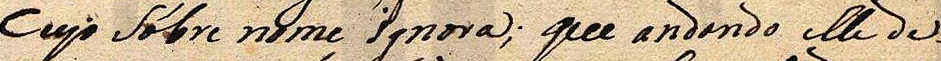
Cujo Sobrenome ignora; que andando elle de
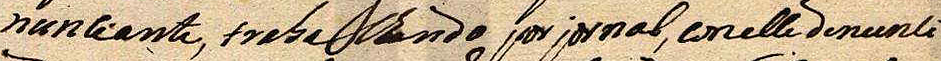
nunciante, trabalhando por jornal, con elle denunci
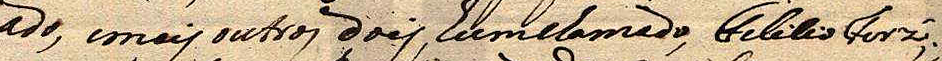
ado, e mais outros dois, hum chamado, FeliCio Ferz̄;
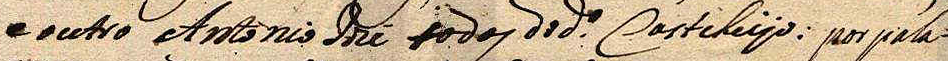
e outro Antonio Iozé todos do d.o Casteleijo: por pala
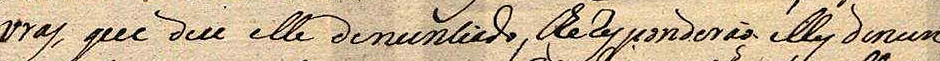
vras, que dece elle denunciado, lhe Responderaõ elles denun
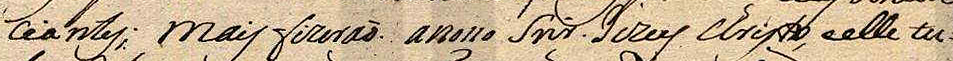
ciantes; mais fizeraõ a nosso snr̄ Iezus Christo, e elle tu
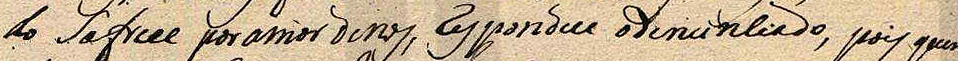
do sofreu por amor de nos, Respondeu o denunciado, pois quem
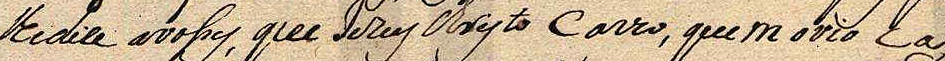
lhe dice a vosses, que Iezus Christo e o veo, quem o vio e a
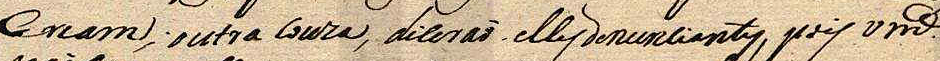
cream; outra couza, diceraõ elles denunciantes, pois vm.ce
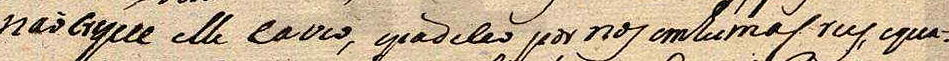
naõ cryece elle e a veo, e padeceo por nos em huma Crus, e qua
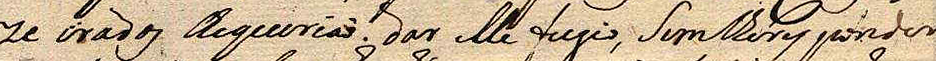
ze irados Requeriaõ. dar elle fugio, sem lhe responder
